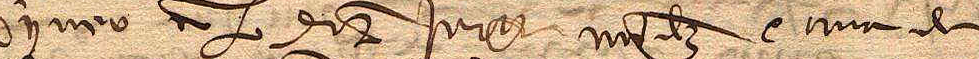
vyueo c̄o ho dito Jorge mēdez e ana de
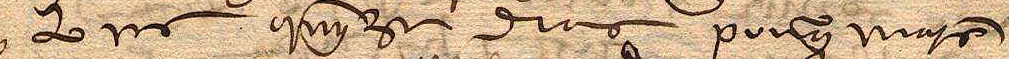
tores quȳze dias pouqo majs
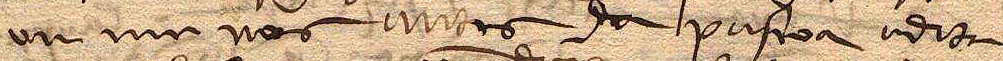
ou menos antes da pascoa a dita
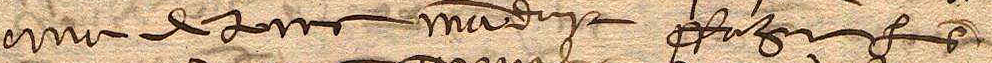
ana de tores mādara ffazer hūs
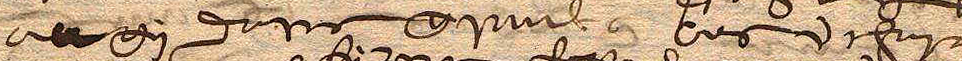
allgydares grande e os ēchera
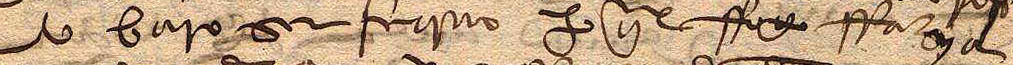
do baro ser sequo ho q̄l ffogo ffazya
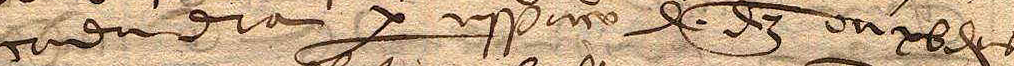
cada dia ꝑ espaco de dez ou xb djas
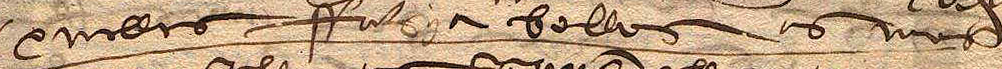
e nelles fazia bollos asmos
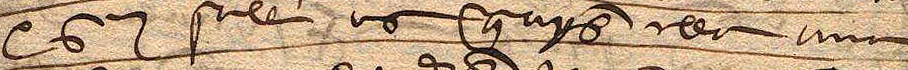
e sem sall os q̄ays ella ana
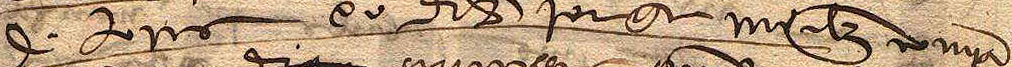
de tores e o dito jorge mēdez comjā
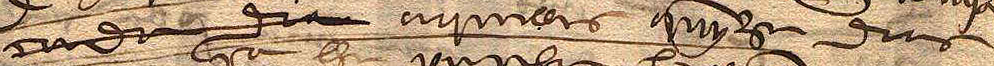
cada dia aquelles quȳze dias
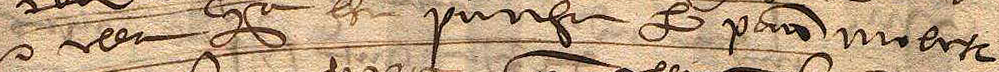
e ella tsa lhe punha ho paõ molete
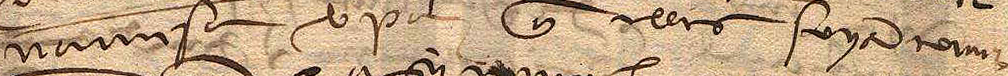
na mesa do pam q̄ elles soyā comer
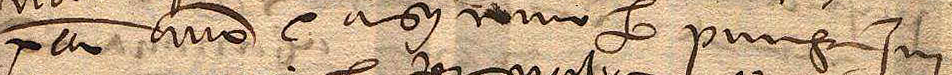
p̄llo an̄o e asy como ho punha Jm
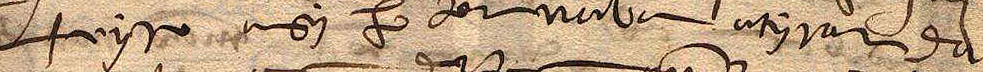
teyro asy ho tornava a tyrar du
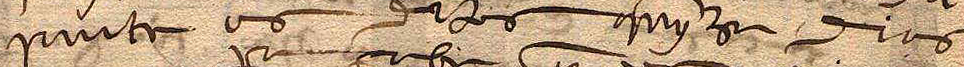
rante os ditos quȳze dias
